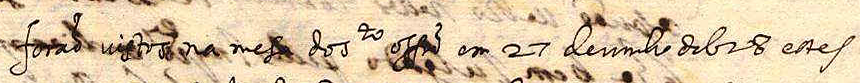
foraõ uistos na mesa do sto offiō em 27 de iunho de 628 estes
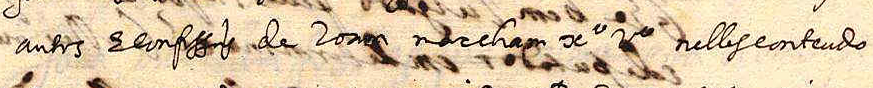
autos E confissaõ de Joam marcham xo Vo nelles conteudo
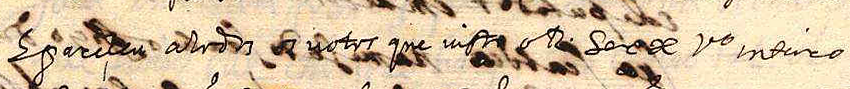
E pareceu a todos os uotos que uisto o R. ser xo Vo inteiro
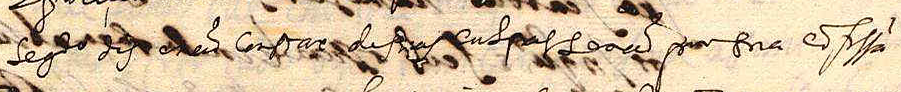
segdo dis e naõ constar de suas culpas senaõ por sua cōfissaõ
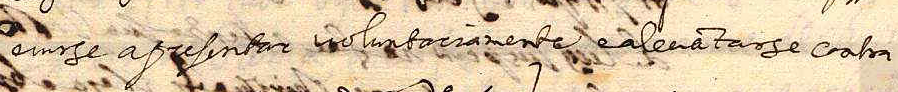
e uirse apresentar uoluntariamente e aleuātarse contra
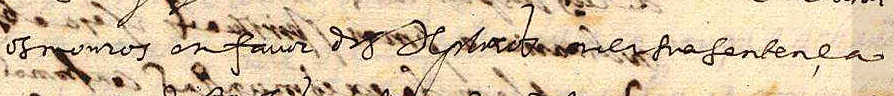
os mouros em fauor dos Xphaõs auer sua sentença
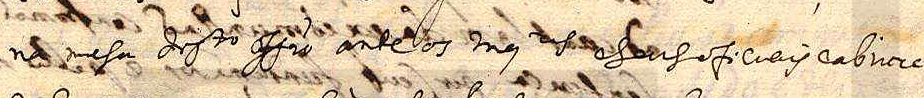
na mesa do sto offiō ante os Inqres e seus oficiais e abiure
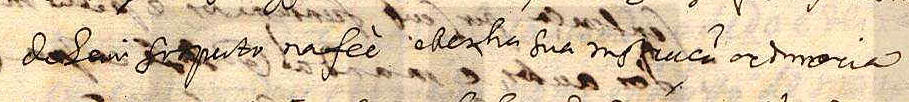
de Leui sospeito na feé e tenha sua instruçaõ ordinaria
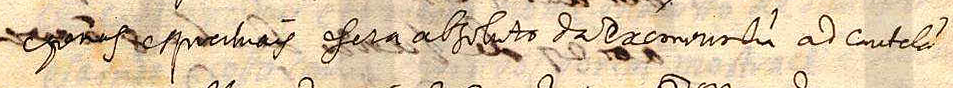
e penas espirituais e seia absoluto da excomunhā ad cautelā
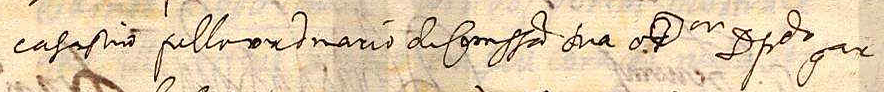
e asistio pello ordinario de Comissaõ sua o Dor Dpdo gar
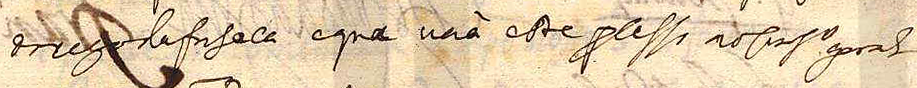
do rego da fonseca e que uaà este ꝓcesso ao Cons.o geral
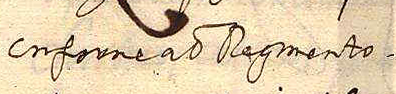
conforme ao Regimento.
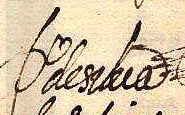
Po de silua
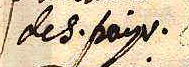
de s. pajo.
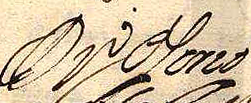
Djo Osorio
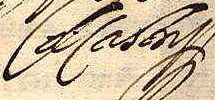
de Castro
